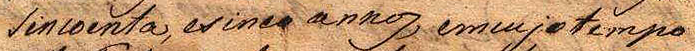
sincoenta, e sinco annos, em cujo tempo
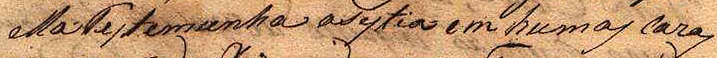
ella Testemunha asistia em humas cazas
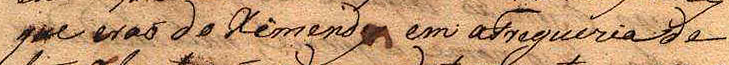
que eraõ do Ximendes em a Freguezia de
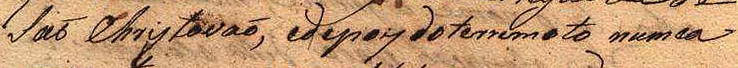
São Christovaõ, e depois do terremoto numca
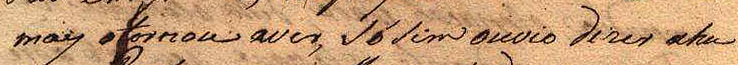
mais o tornou a ver, só sim ouvio dizer a hu
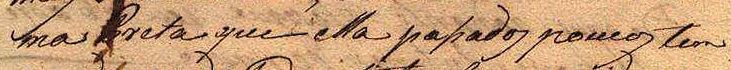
ma Preta que ella passados poucos tem
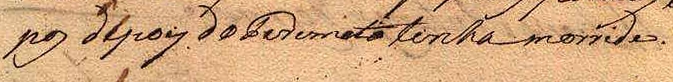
pos depois do Teremoto tinha morrido.
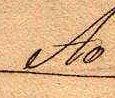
Ao
